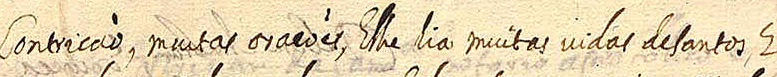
Contricaõ, muitas oracoẽs, E lhe lia muitas uidas de Santos, E
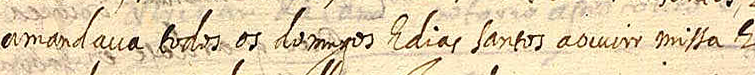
a mandaua todos os domingos E dias Santos a ouuir missa E
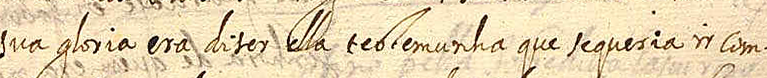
sua gloria era diser ella testemunha que se queria ir com
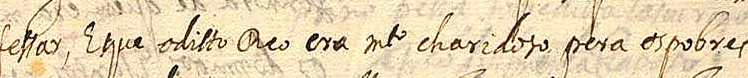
fessar, E que o ditto Reo era mto charidoso pera os pobres
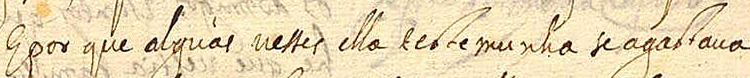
E por que alguās uesses ella testemunha se agastaua
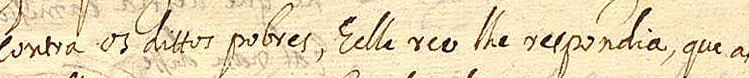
contra os dittos pobres, E elle reo lhe respondia, que as
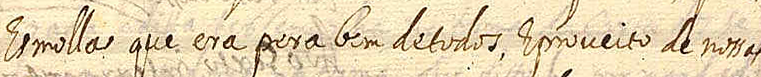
Esmollas que era pera bem de todos, E proueito de nossas
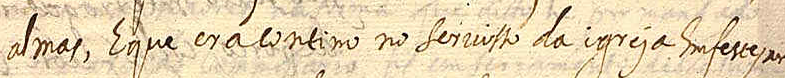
almas, E que era contino no Seruisso da igreja Em festejar
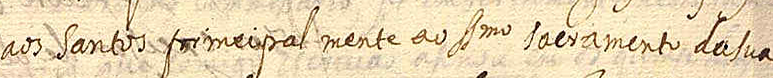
aos Santos principalmente ao Ssmo sacramento da sua
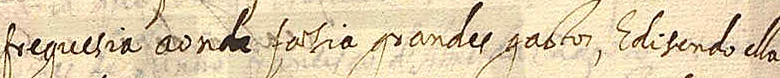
freguesia aonde fazia grandes gastos, E disendo ella
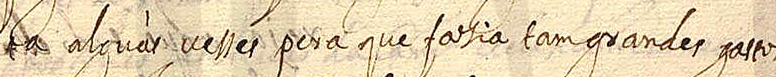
ta alguās uesses pera que fazia tam grandes gastos
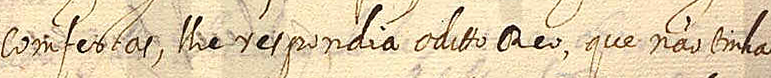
com festas, lhe respondia o ditto Reo, que não tinha
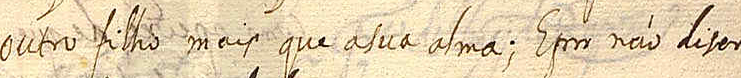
outro filho mais que a sua alma; E por não diser
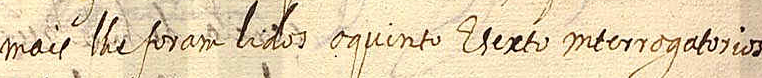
mais lhe foram lidos o quinto E sexto interrogatorios
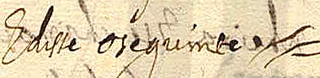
E disse o seguinte //-
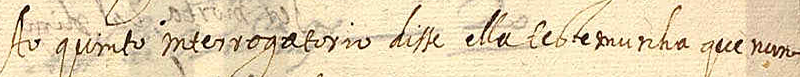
Ao quinto interrogatorio disse ella testemunha que nun
